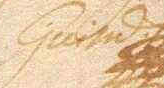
Guimes
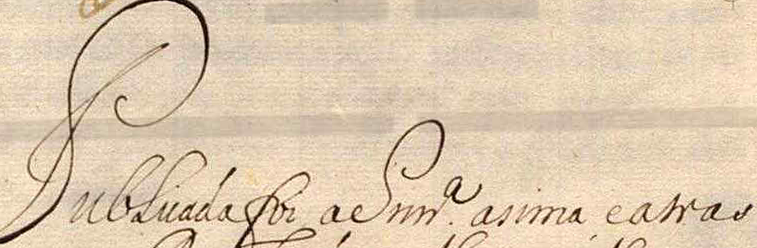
Publicada foi a Snn.a asima, e atras
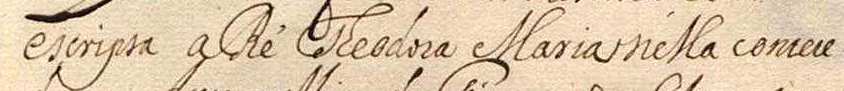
escripta a Ré Theodoza Maria nella conteu
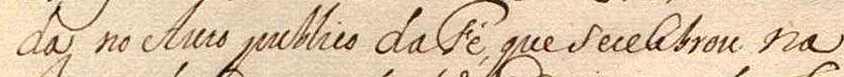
da no Auto publico da Fé, que se celebrou na
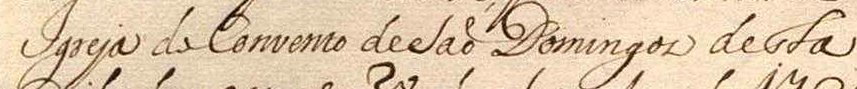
Igreja do Convento de Saõ Domingoz desta
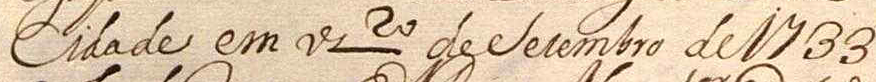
Cidade em os 20 de Setembro de i733.
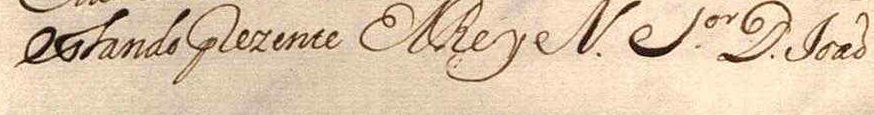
estando prezente El Rey N. S.or D. Ioaõ
